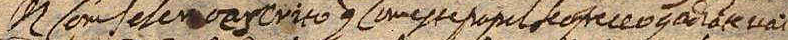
N Com se ler o escrito q̄ Com este papel se ofreceo q̄ adiāte uai
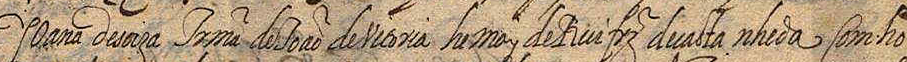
Yoana de soiza Irmā de Ioaõ de Vitoria he may de Rui frz̄ de castanheda Com ho
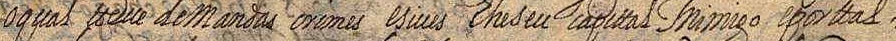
o qual tteue demandas crimes e siues E he seu capittal Inimigo e por ttal
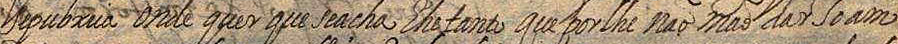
se pubrica onde quer que se acha E he tanto que por lhe naõ maõdar Ioam
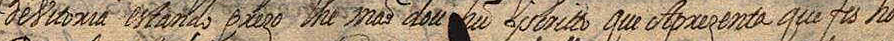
de Vitoria estando prezo lhe maõdou hū yscritto que Aprezenta que fes ho
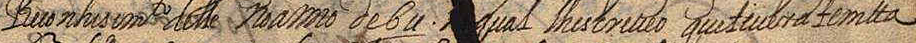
Reconhisimto delle no anno de 611 o qual lhescreueo que tiuera temtta
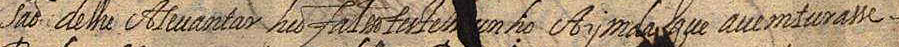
saõ de lhe Aleuantar hū falsso teste_unho Aymda que auemturasse
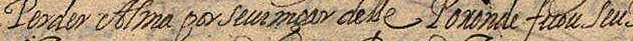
Perder Alma por se uimgar delle Por onde ficou seu
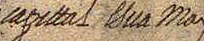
capittal e sua may
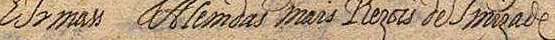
E Irmass Alem das mais Rezoiz de Imizade
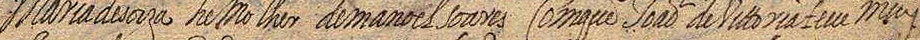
Maria de soiza he molher de manoel soares Com quē Ioaõ de Vittoria teue muy
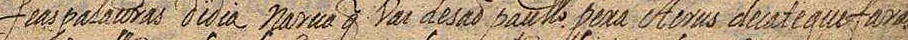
feas palauras di dia na rua q̄ Vai de saõ paullo pera A crus de catequefaras
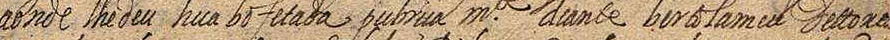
aonde lhe deu hua bofetada pubricam.te diante bertolameu De ttores
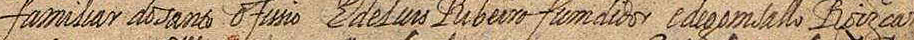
familiar do santo ofissio E de Luis Ribeiro fumdidor e de gomsallo Roiz̄ car
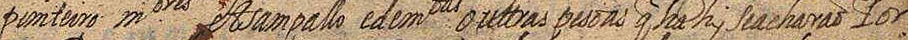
pimteiro mores A sam pallo e de mtas outtras pesoas q̄ hahy se acharaõ Por
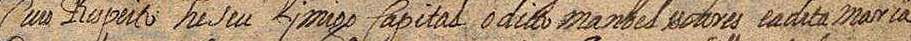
Cuio Respeito he seu ymigo Capital o ditto manoel ssoares e a dita maria
